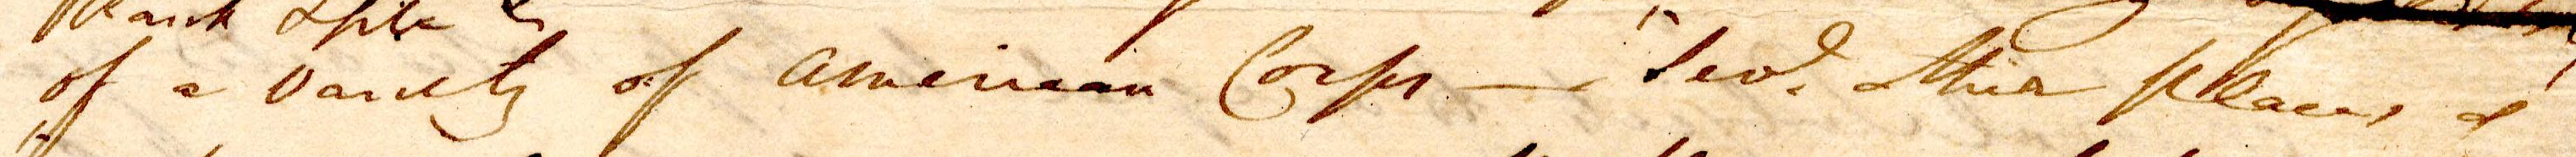of variety of American Corps. Sev^l other places of
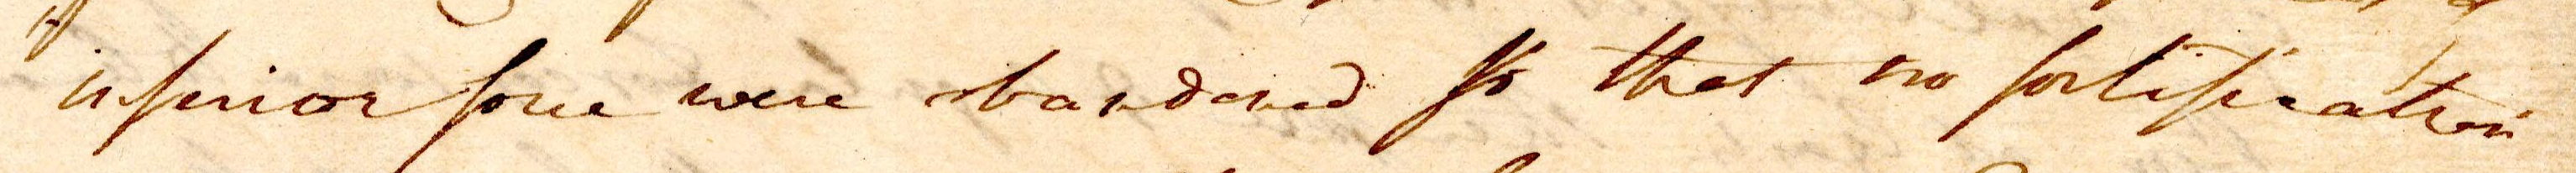inferior force were abandoned so that no fortification
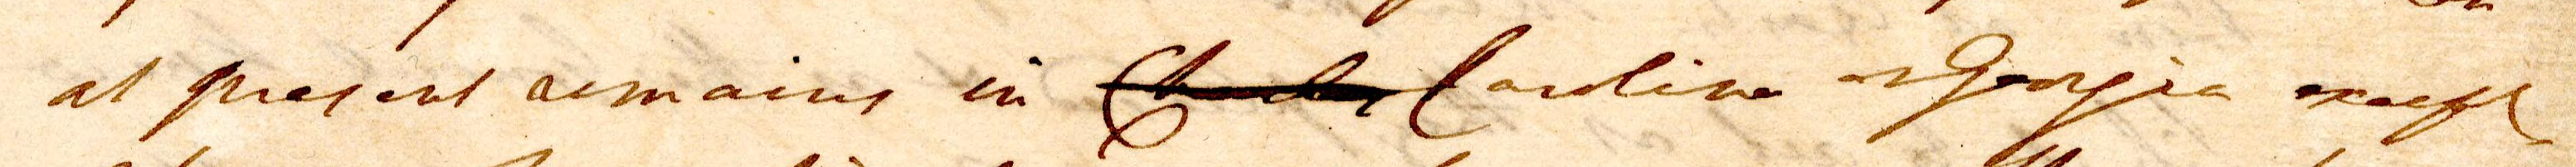at present remains in Charles Carolina or Georgia exactly
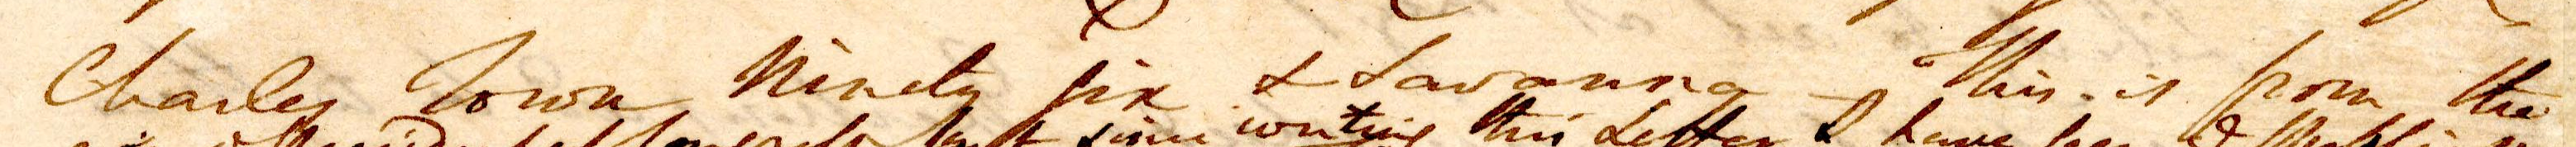Charles Town Ninety Six & Savanna. This is from the
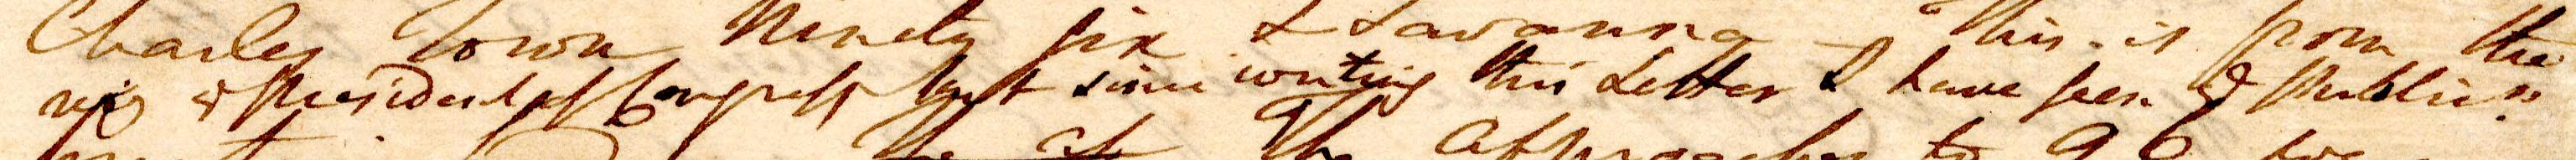of y^e President of Congress but since writing this Letter I have seen y^e Public."
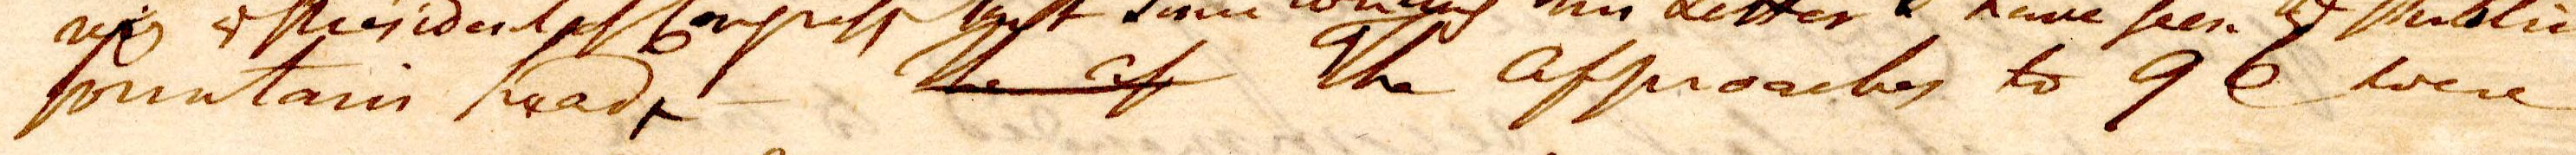fountain head ^ the of the Approaches to 96 were
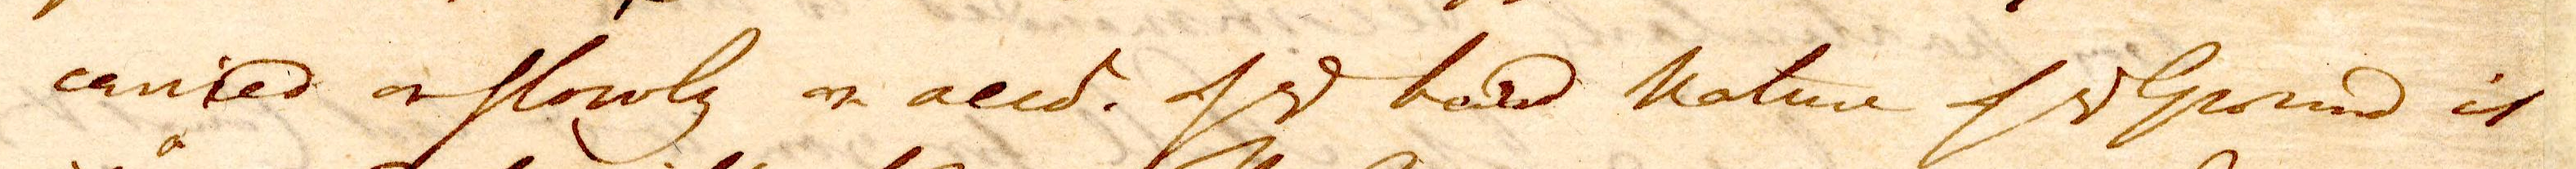carried on slowly or acced^. of y^e bad Nature of y^e Ground it
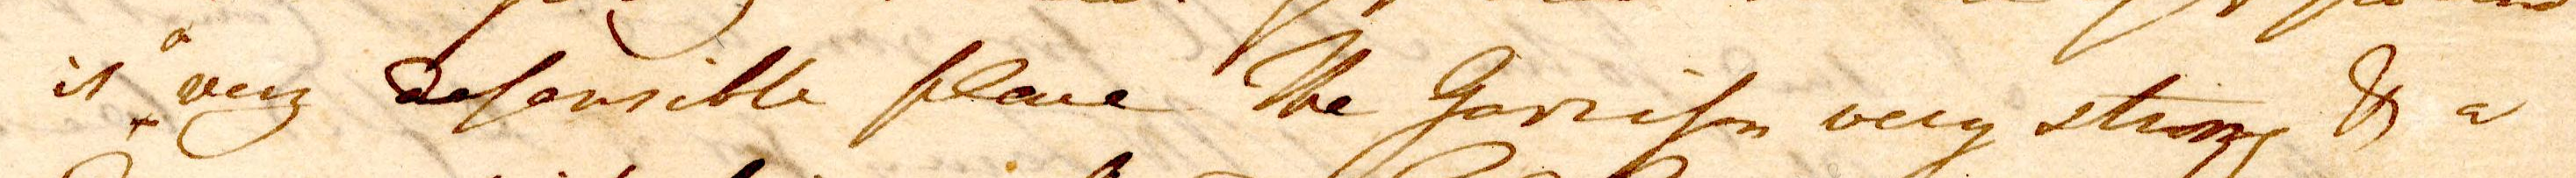is ^ very defensible place. The Garrison very strong & a
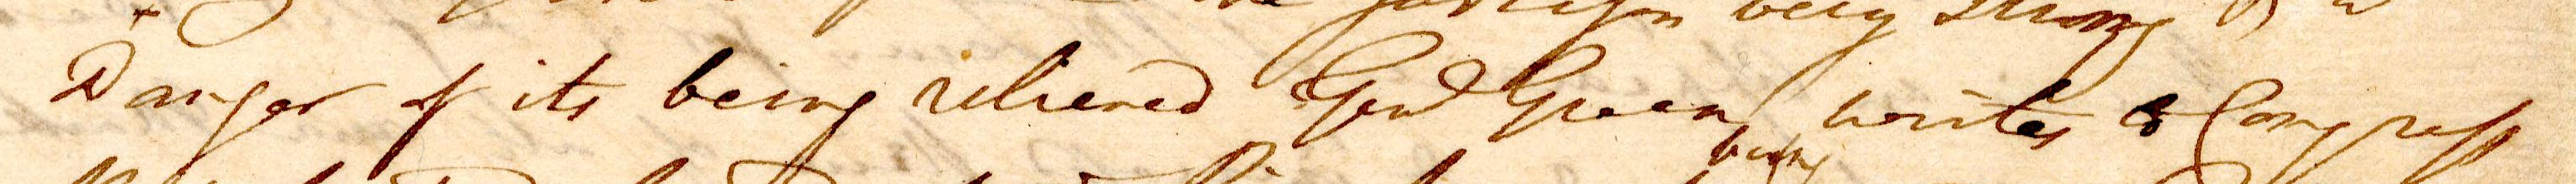Danger of its being relieved Gen^l Green writes to Congress
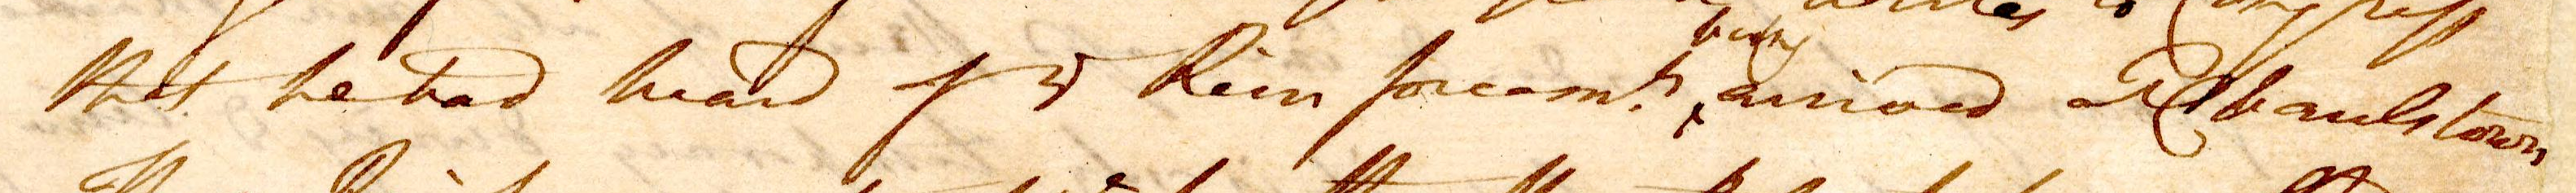that he had heard of y^e Reinforcem^t. ^ arrived at Charlestown
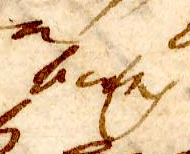very
